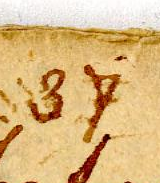37
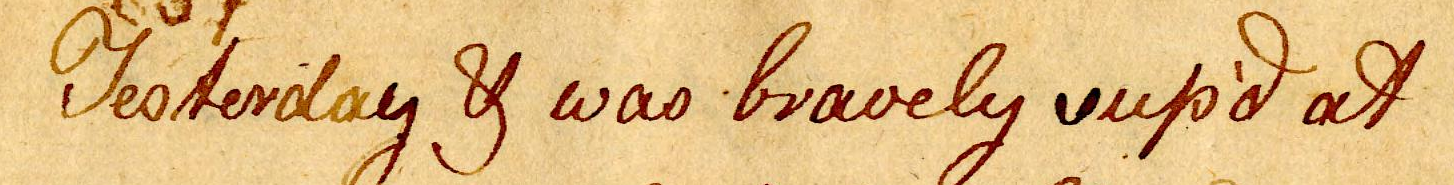Yesterday & was bravely sup'd at
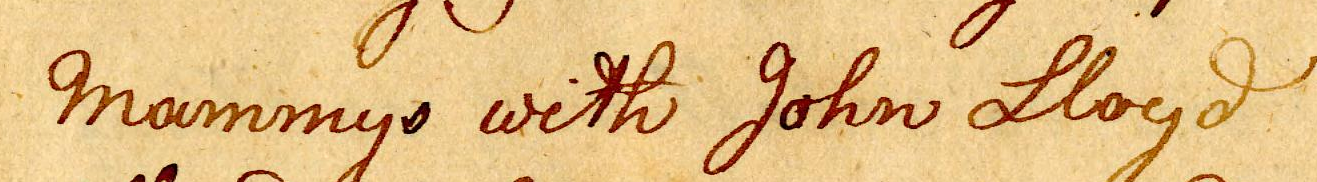Mammys with John Lloyd
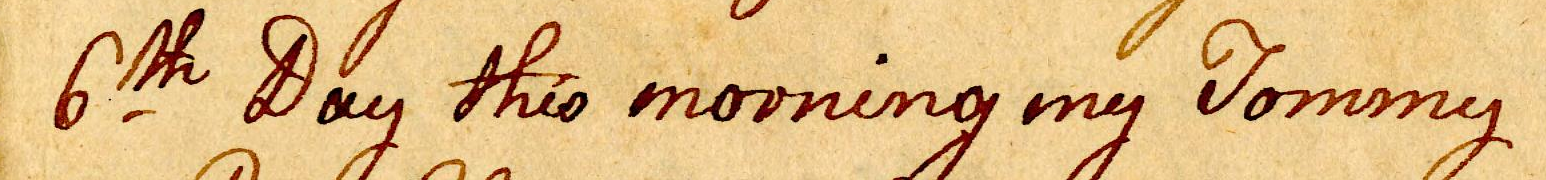6^th Day this morning my Tommy
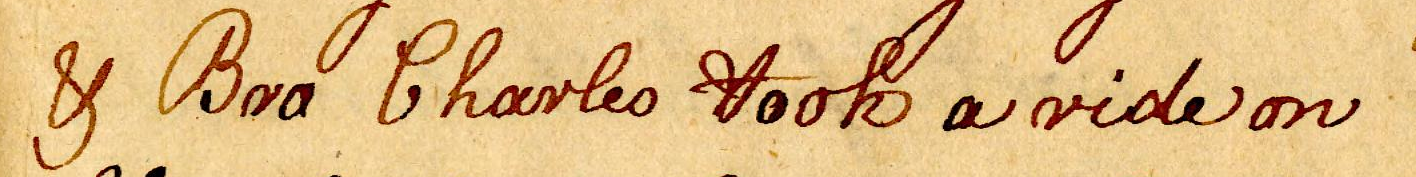& Bro Charles took a ride on
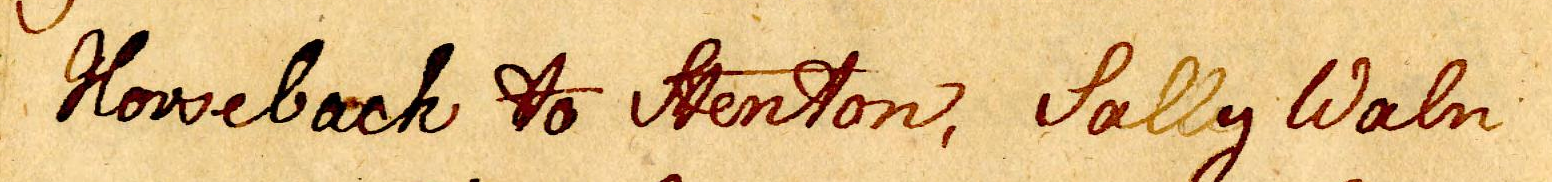Horseback to Stenton, Sally Waln
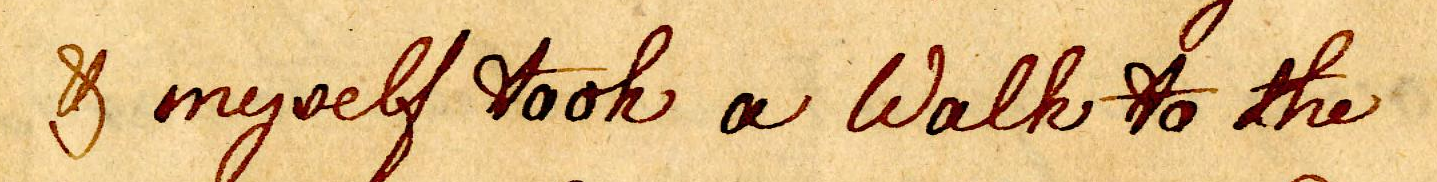& myself took a Walk to the
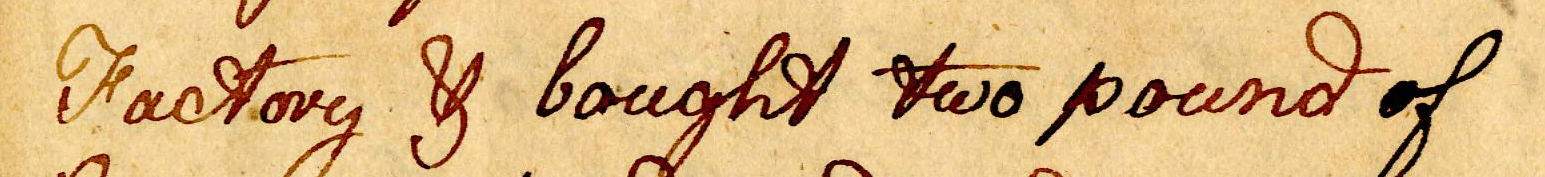Factory & bought two pound of
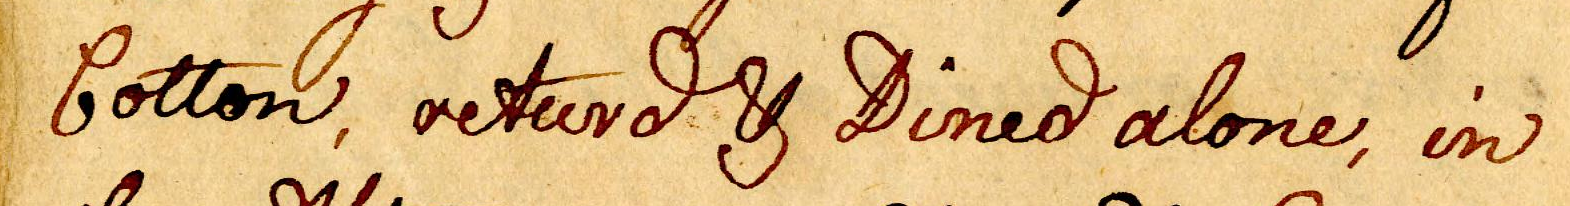Cotton, returd & Dined alone, in
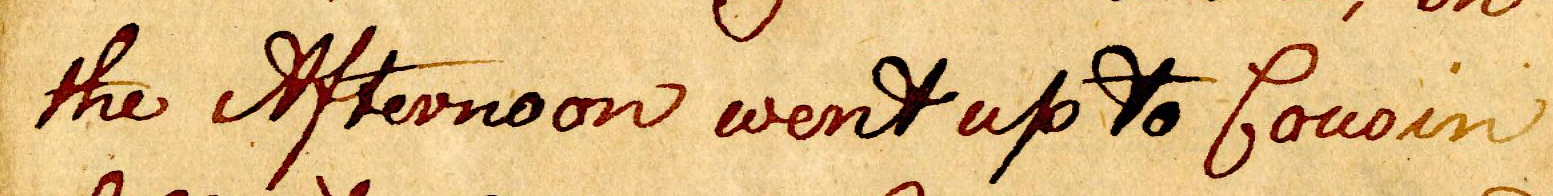the Afternoon went up to Cousin
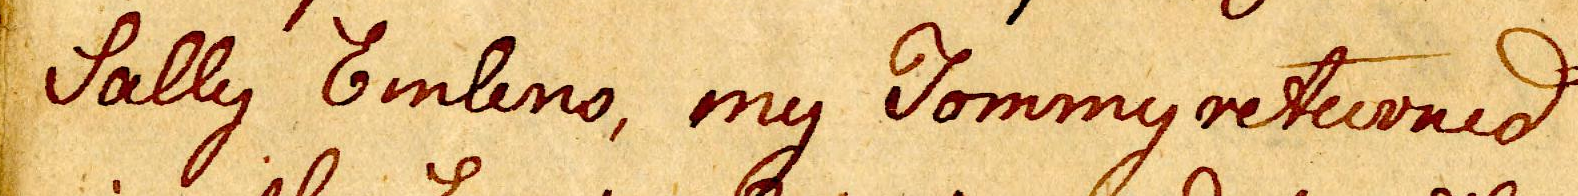Sally Emlens, my Tommy returned
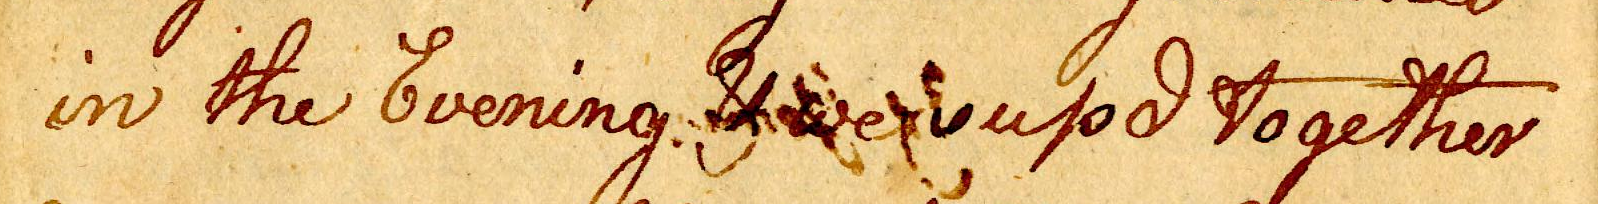in the Evening & we supd together
